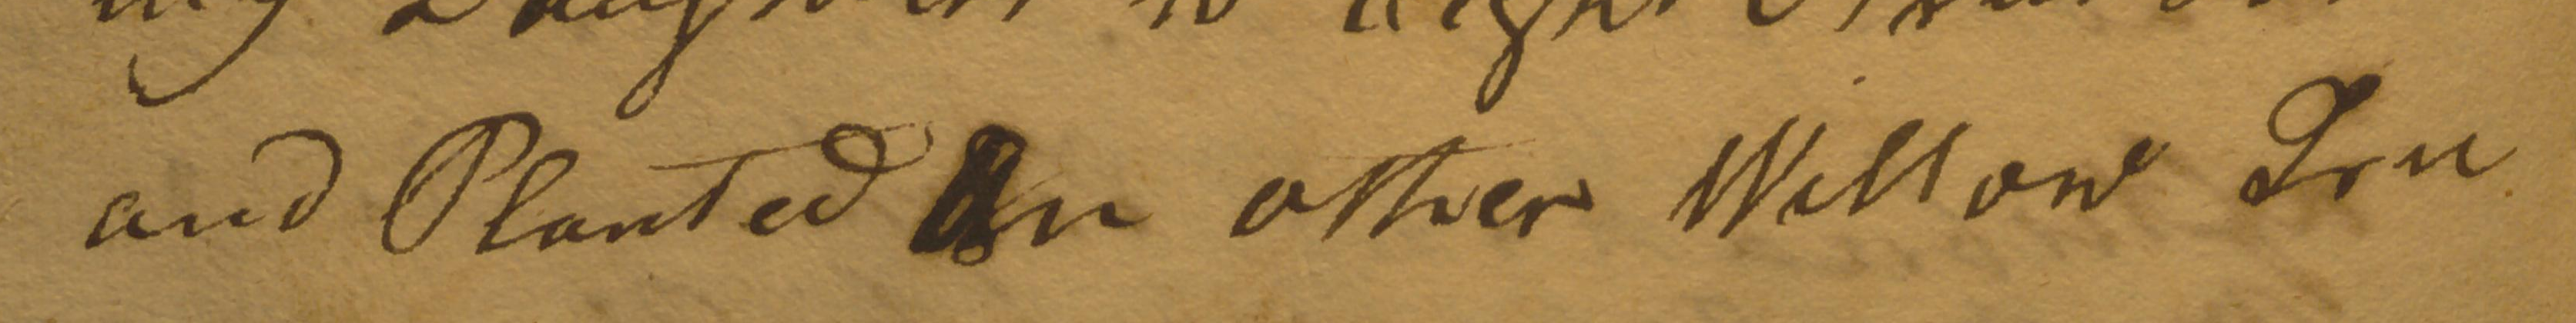and Planted An other Willow Tree
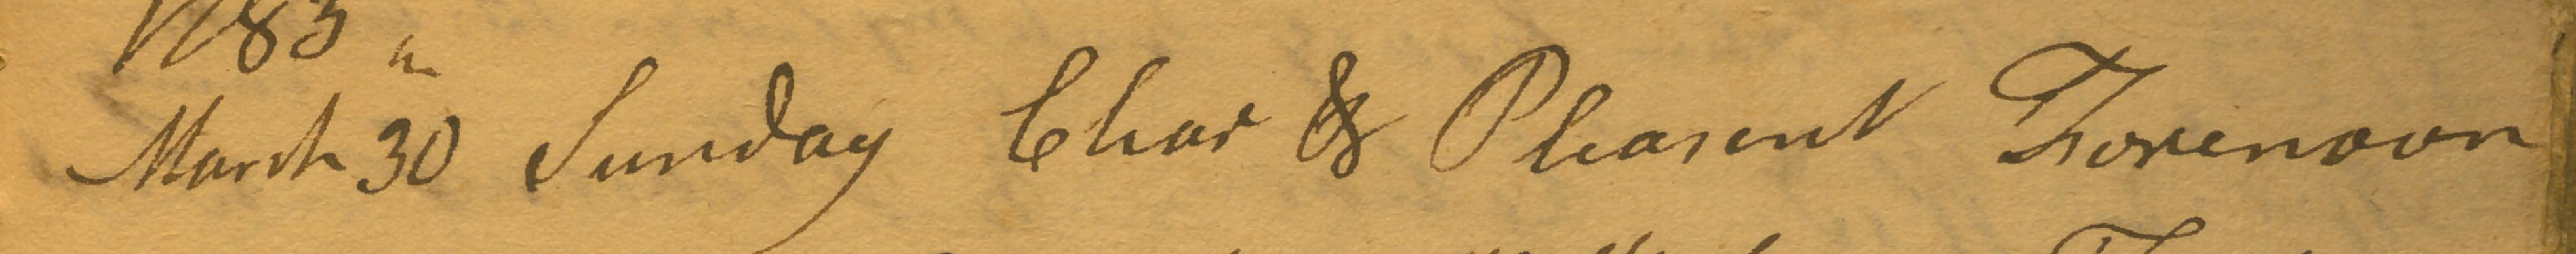March 30^th Sunday Clear & Pleasent Forenoon
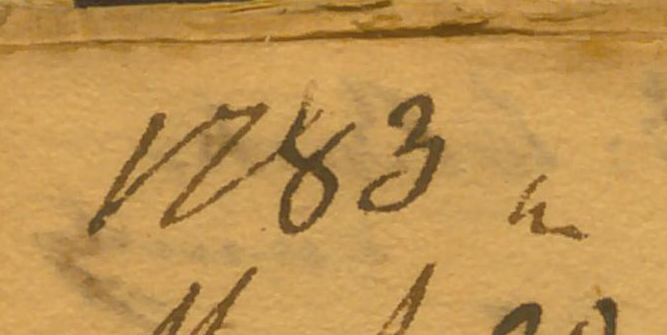1783
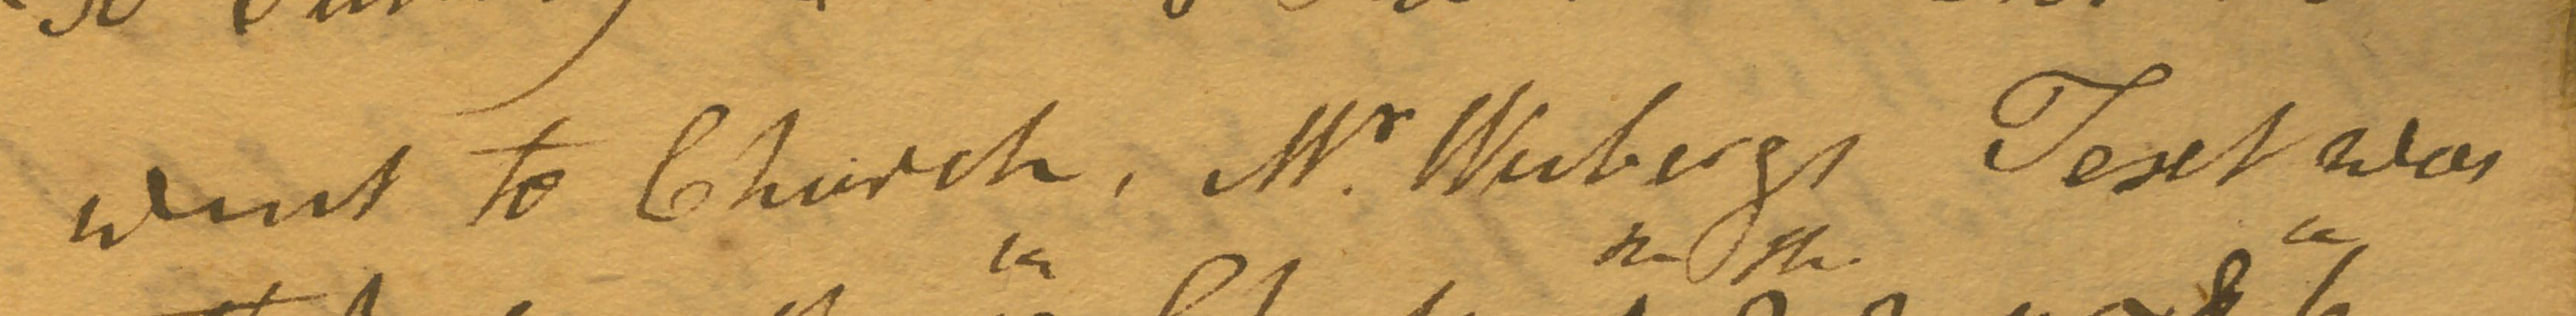went to Church, M^r. Weibergs Text was
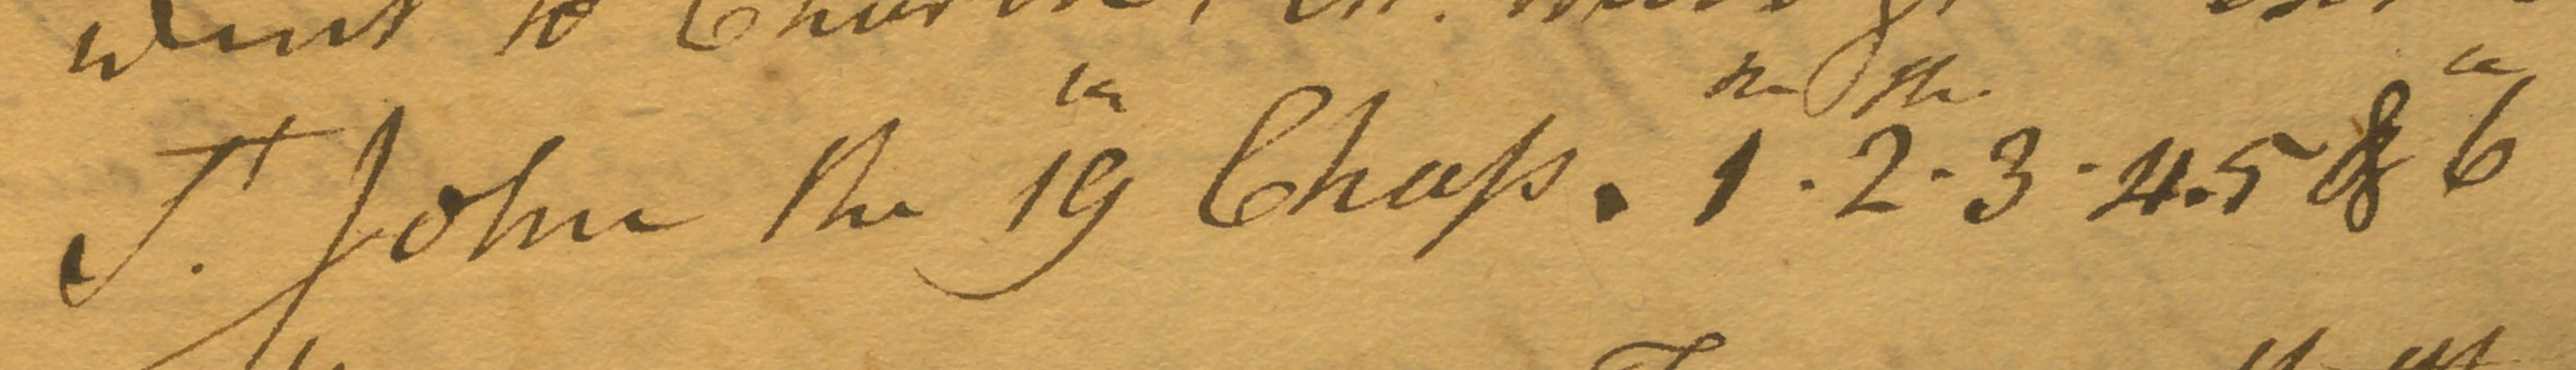S^t. John the 19^th Chap. 1^th. 2^th. 3. 4. 5 & 6^th
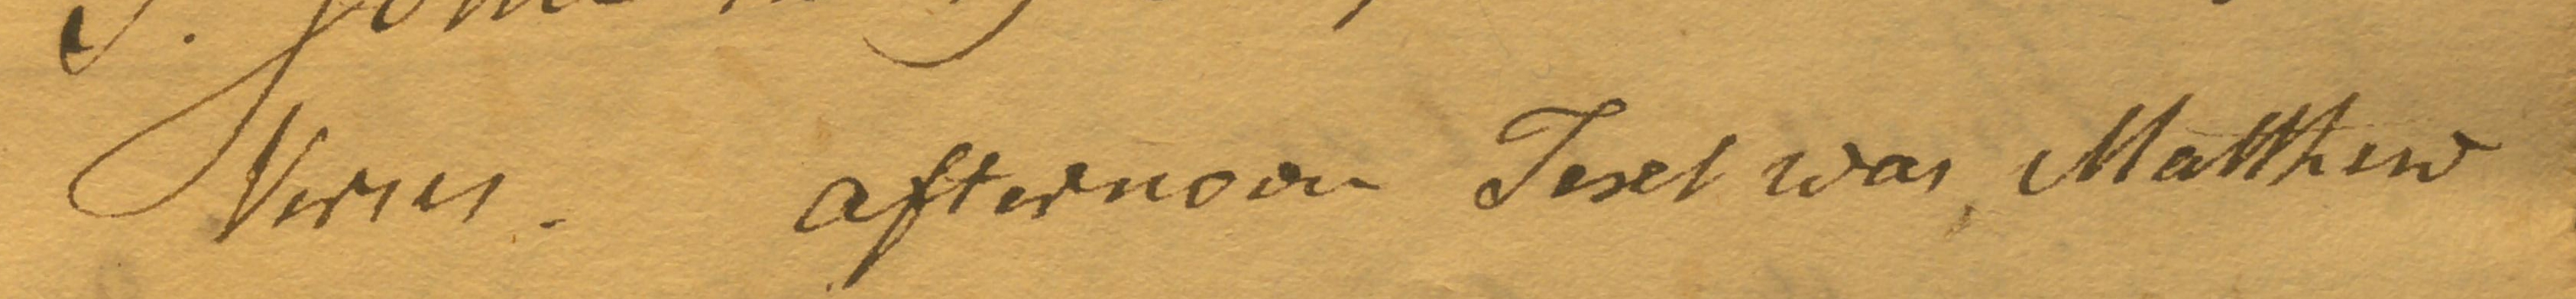Verses. afternoon Text was Matthew
